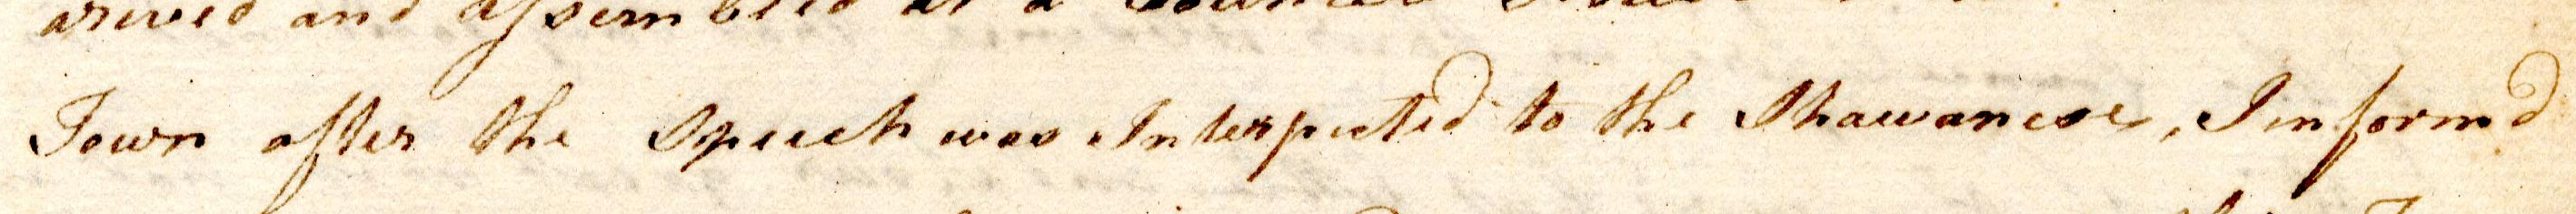Town after the speech was Interpreted to the Shawanese, I inform'd
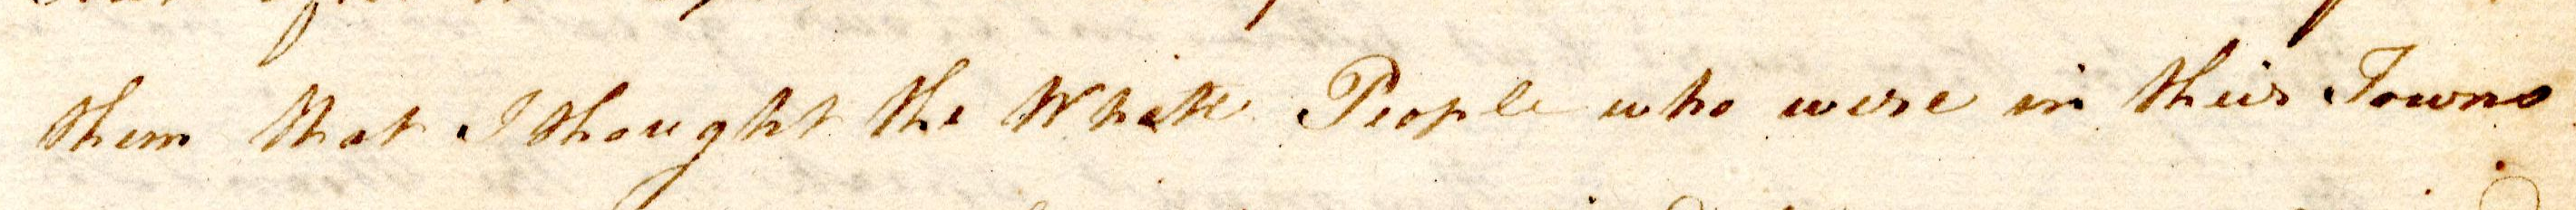them that I thought the White People who were in their Towns
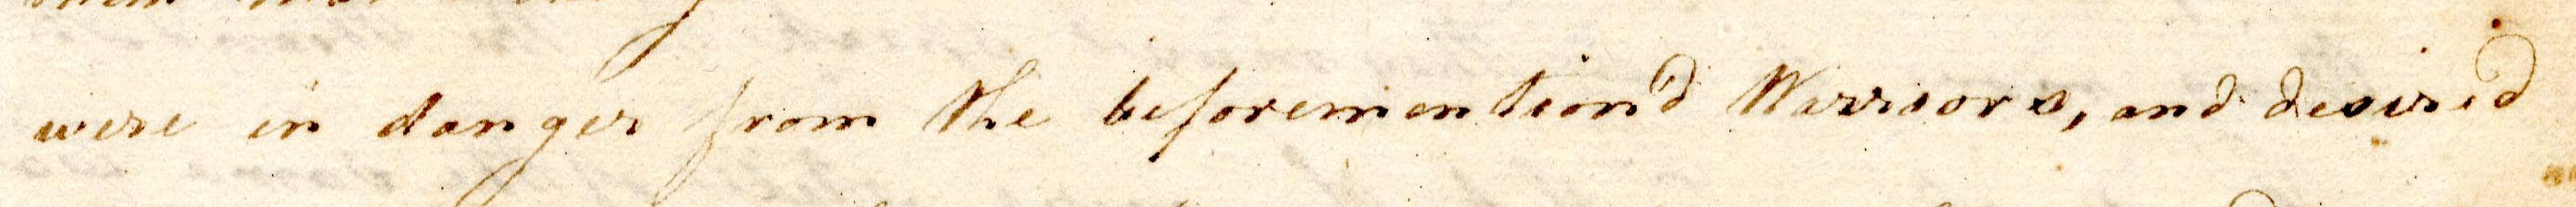were in danger from the before mention'd Warriors, and desir'd
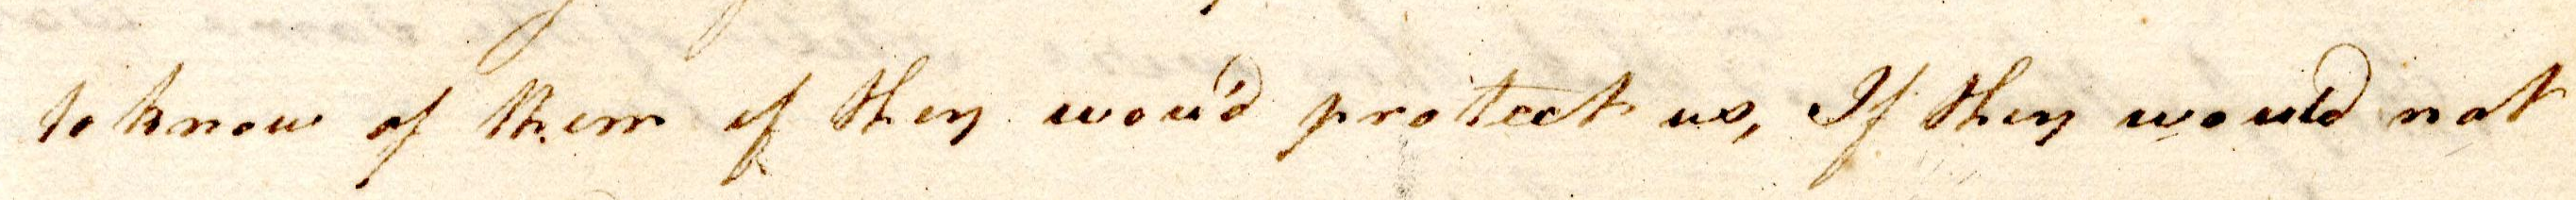to know of them if they wou'd protect us, If they would not
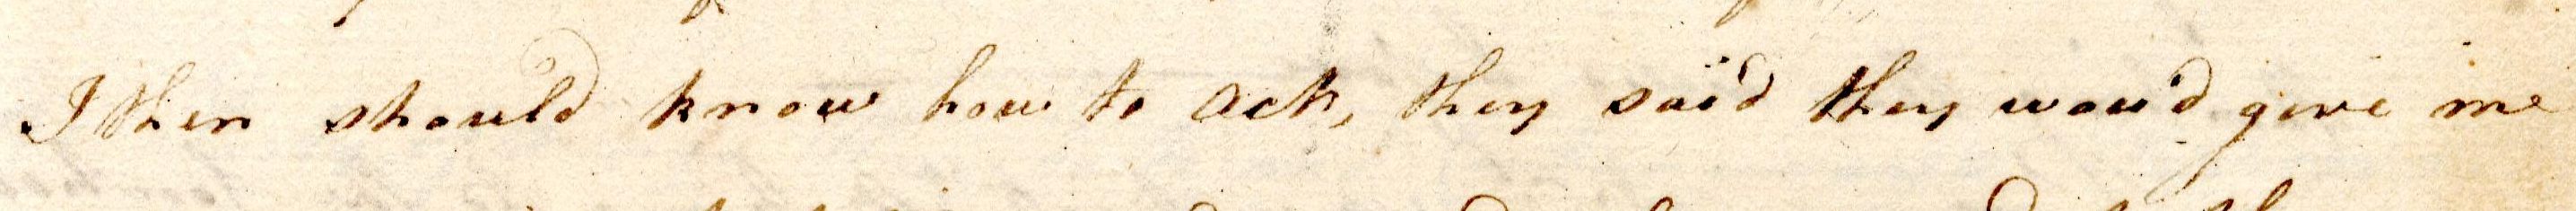I then should know how to act, they said they wou'd give me
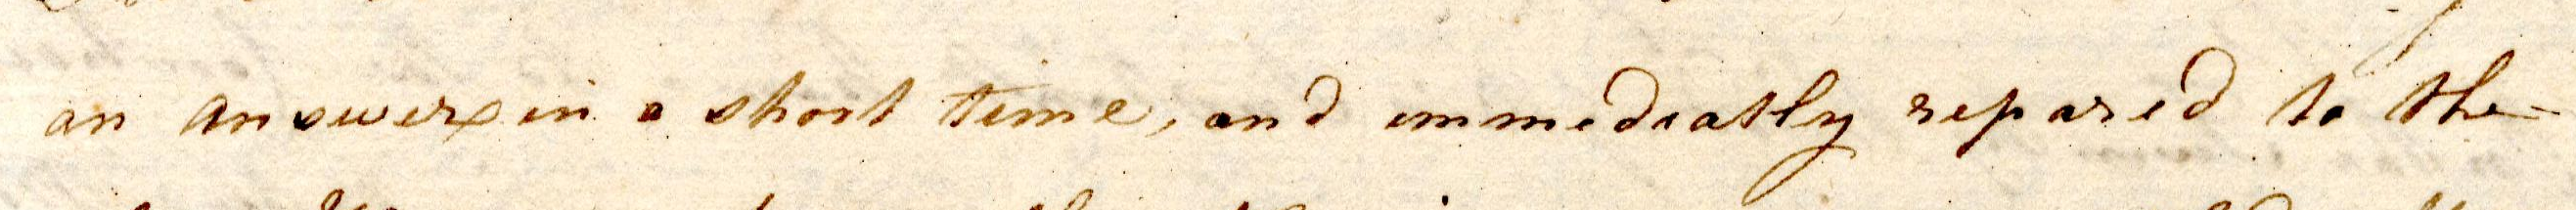an answer in a short time, and immediatly repared to the
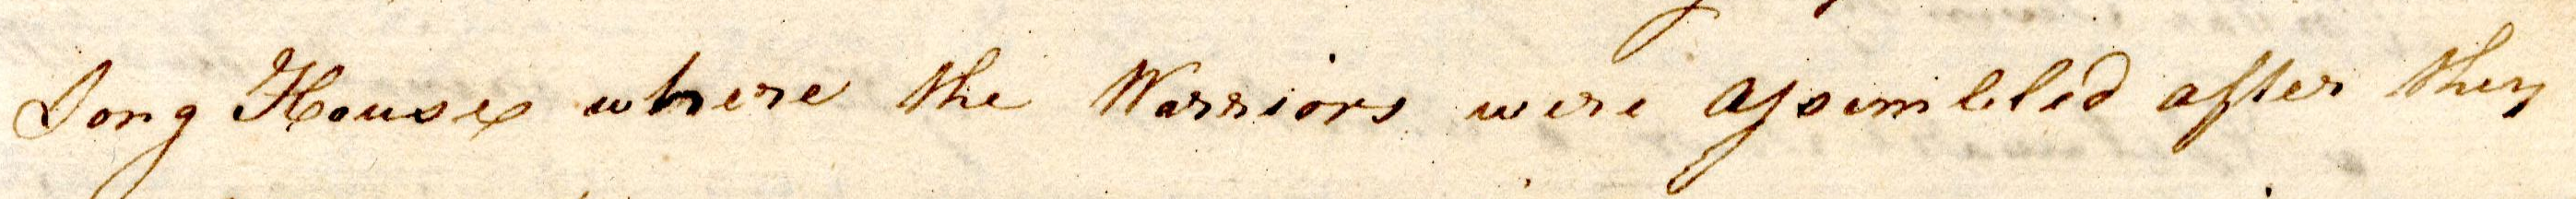Long Houses where the Warriors were assembled after they
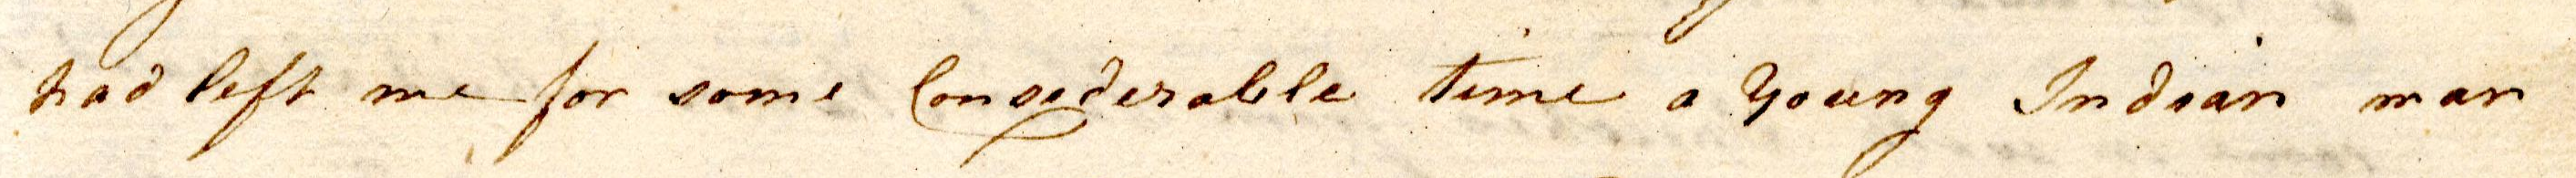had left me for some Considerable time a Young Indian man
